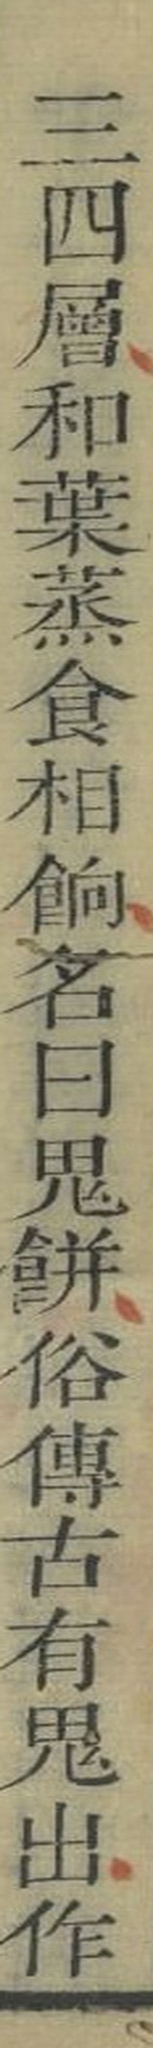三四層和葉蒸食相餉名曰鬼餅俗伝古有鬼出作
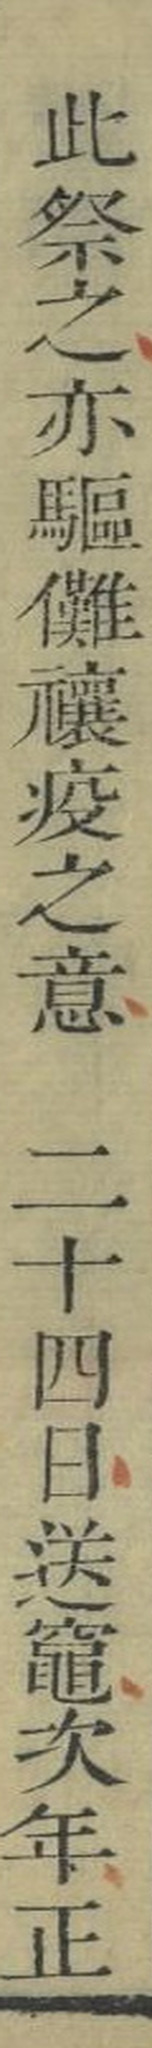此祭之亦駆儺禳疫之意二十四日送竈次年正
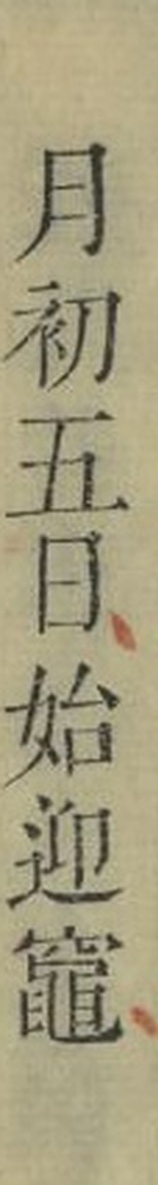月初五日始迎竈
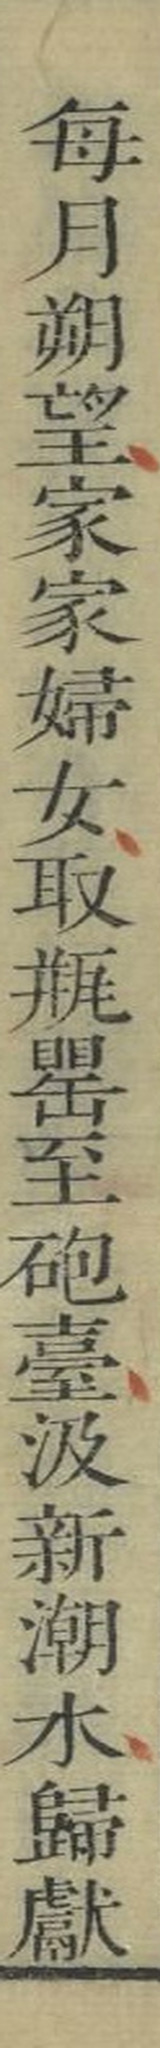毎月朔望家家婦女取瓶罌至砲台汲新潮水帰献
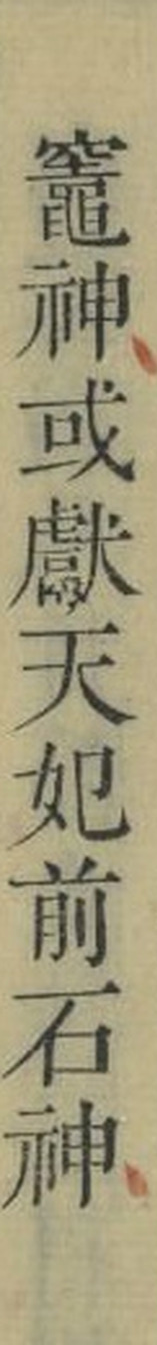竈神或献天妃前石神
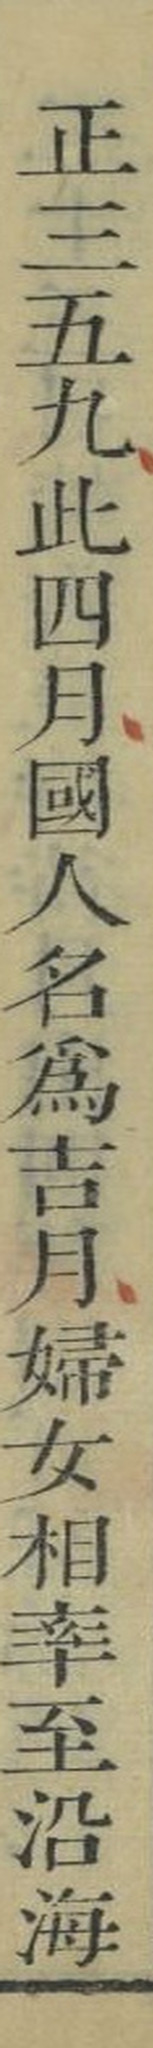正三五九此四月国人名為吉月婦女相率至沿海
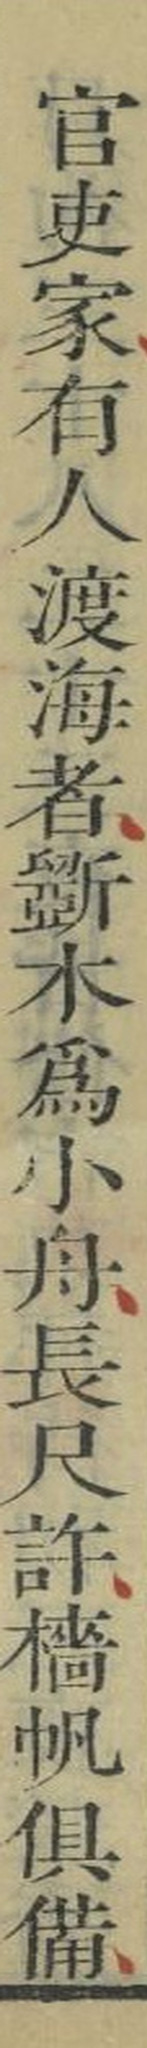官吏家有人渡海者斵木為小舟長尺許檣帆俱備
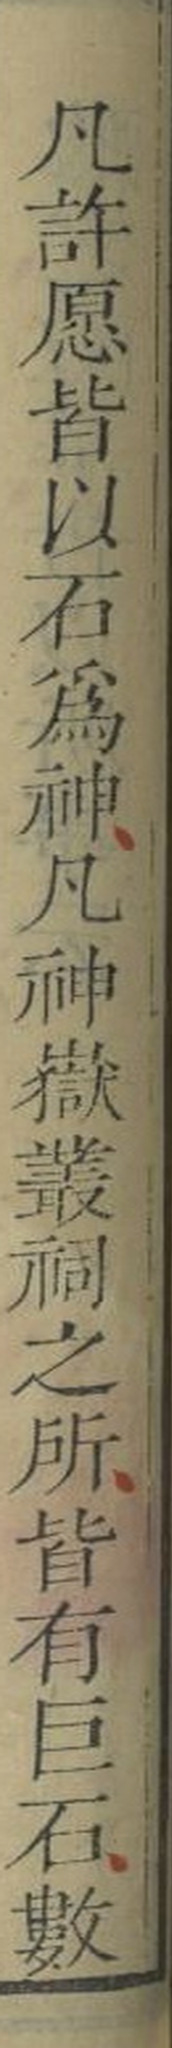凡許愿皆以石為神凡神岳叢祠之所皆有巨石数
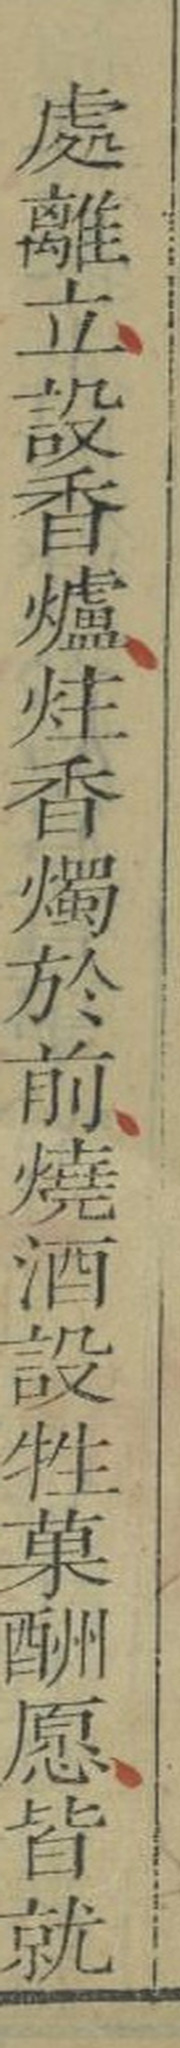処離立設香炉炷香燭於前焼酒設牲菓酬愿皆就
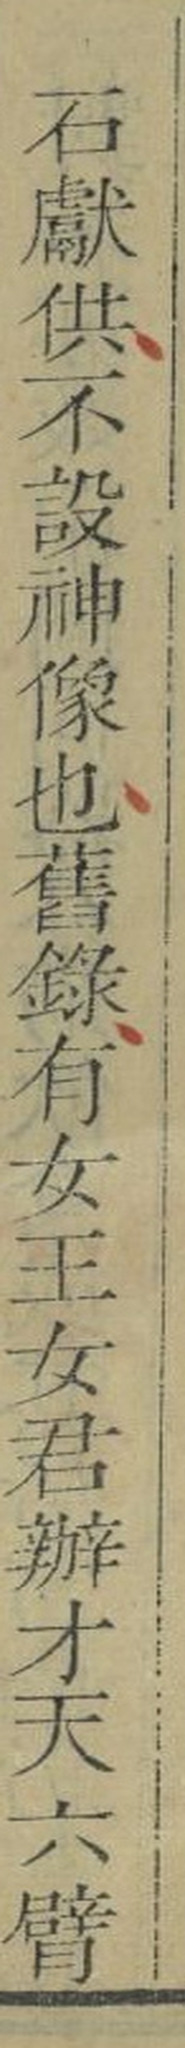石献供不設神像也旧録有女王女君弁才天六臂
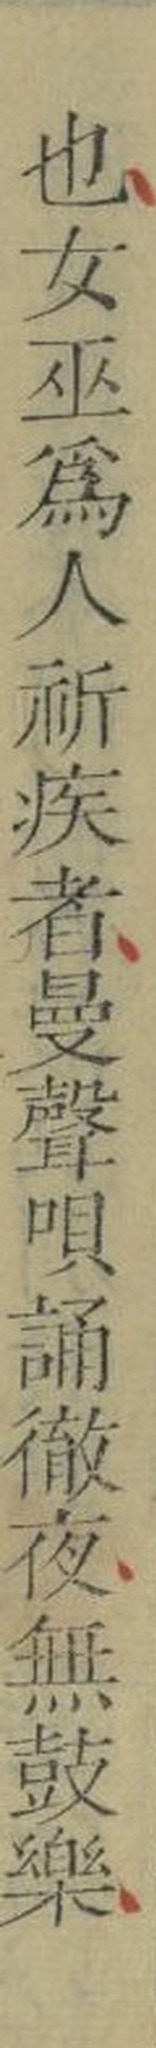也女巫為人祈疾者曼声唄誦徹夜無鼓楽
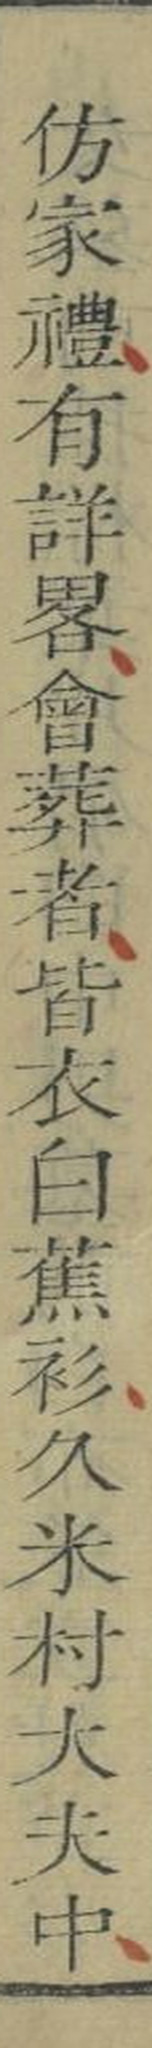仿家礼有詳略会葬者皆衣白蕉衫久米村大夫中
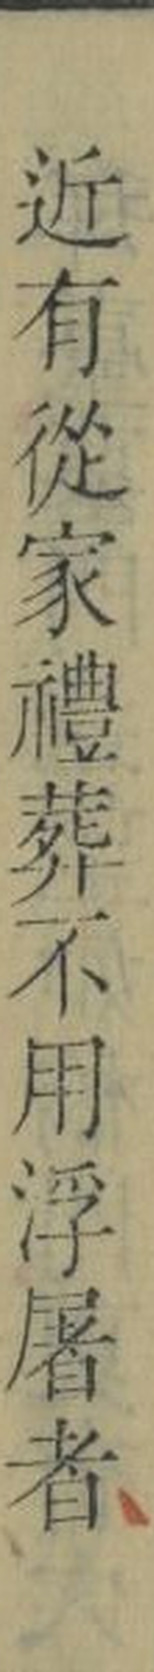近有従家礼葬不用浮屠者
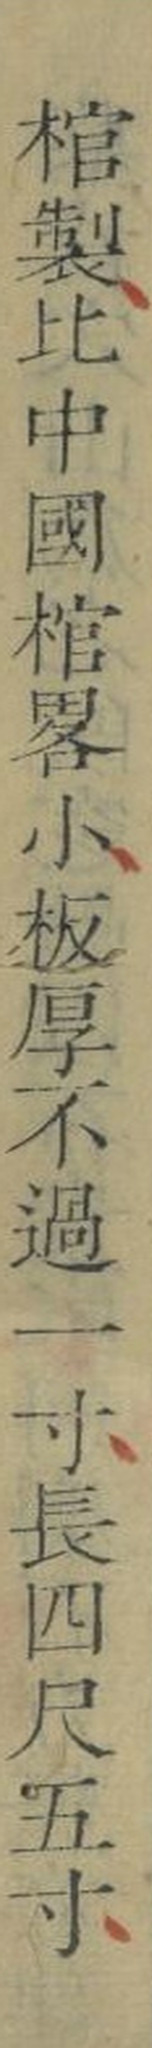棺製比中国棺略小板厚不過一寸長四尺五寸

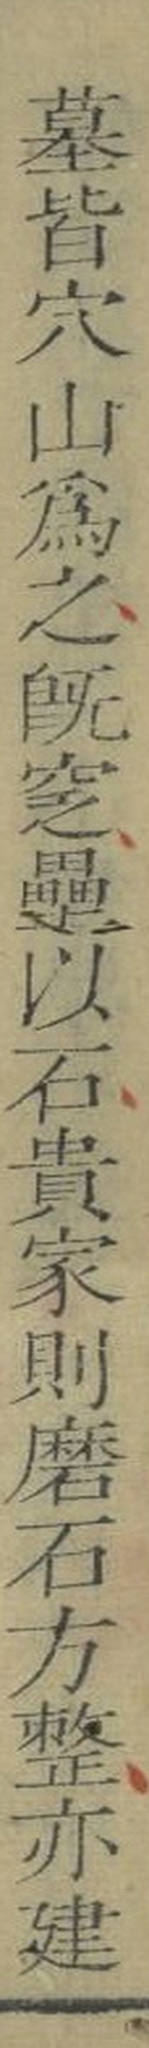墓皆穴山為之既窆壘以石貴家則磨石方整亦建
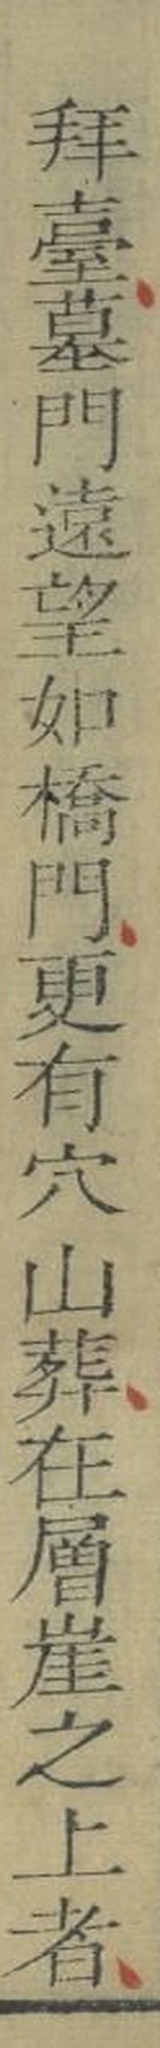拝台墓門遠望如橋門更有穴山葬在層崖之上者
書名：中山伝信録 巻六
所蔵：University of the Ryukyus Library
